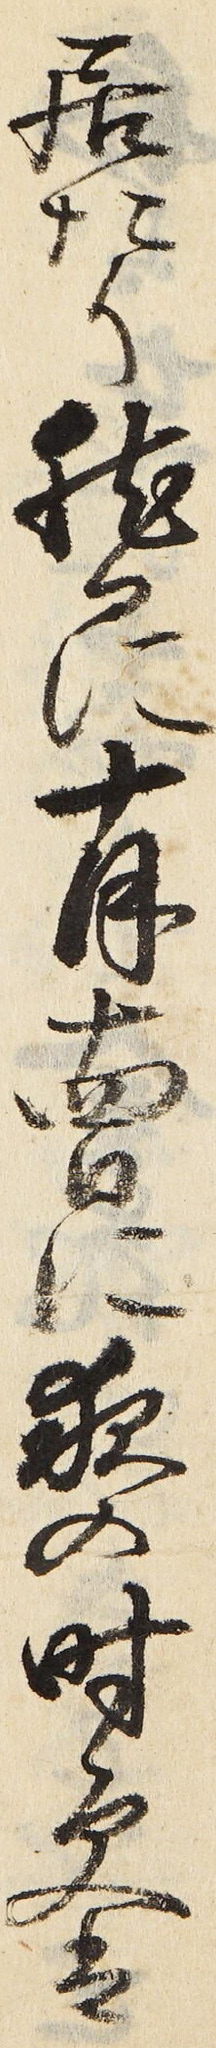居たり然るに十月十四日に夜の時更は
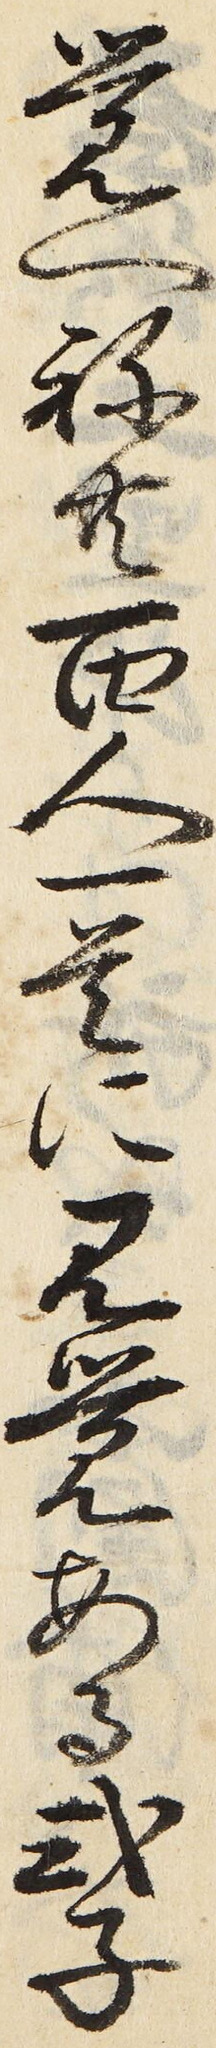覚へね共百人一首に見覚ある式子
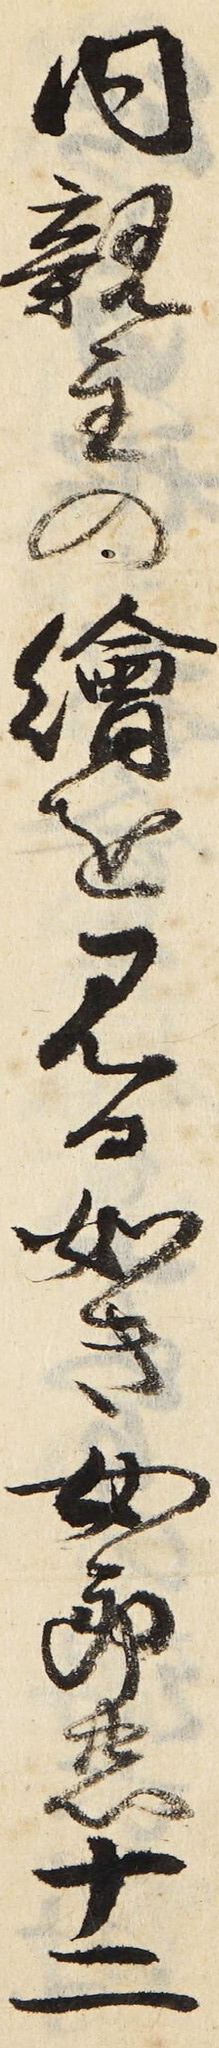内親王の絵を見る如き女郎の十二
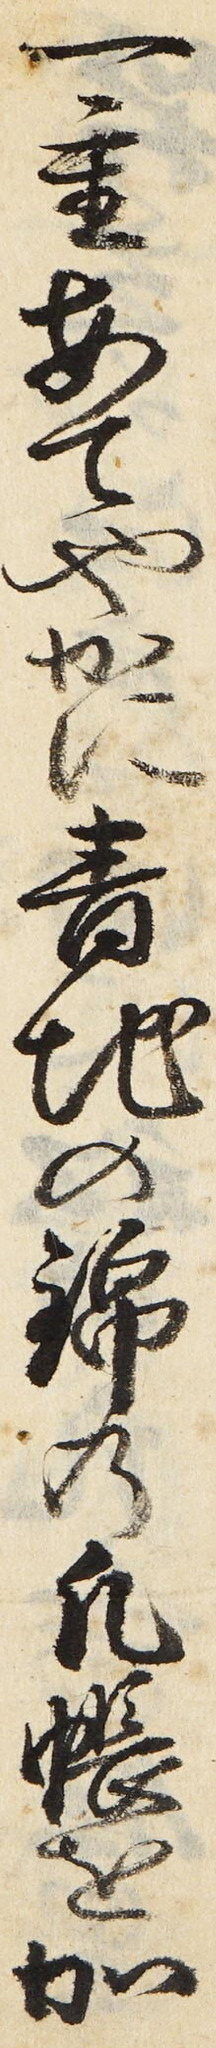一重あてやかに青地の錦の凢帳を加
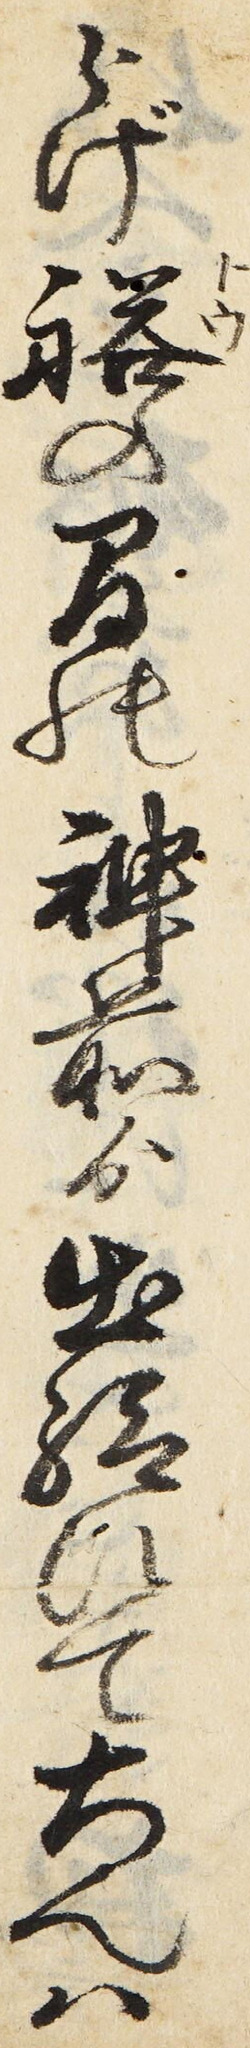らげの間の神前ゟ出給ひてちんは
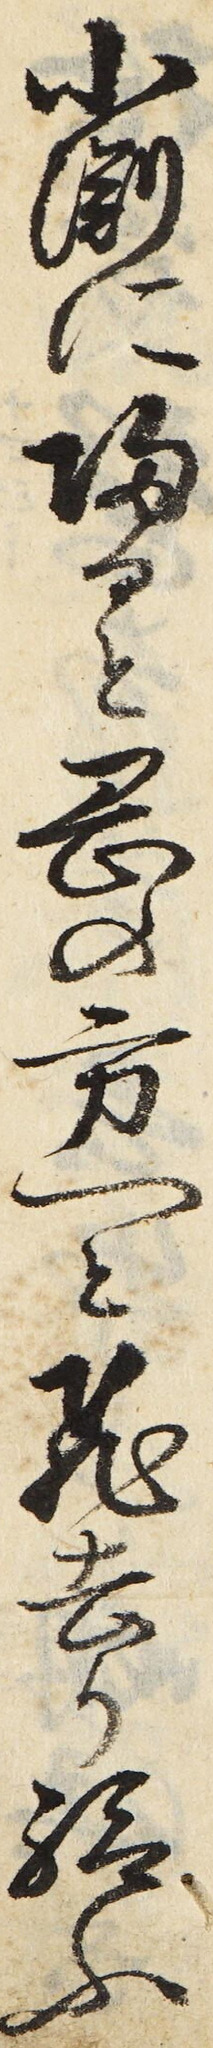小渕に帰ると岡の方へと飛去り給ふ
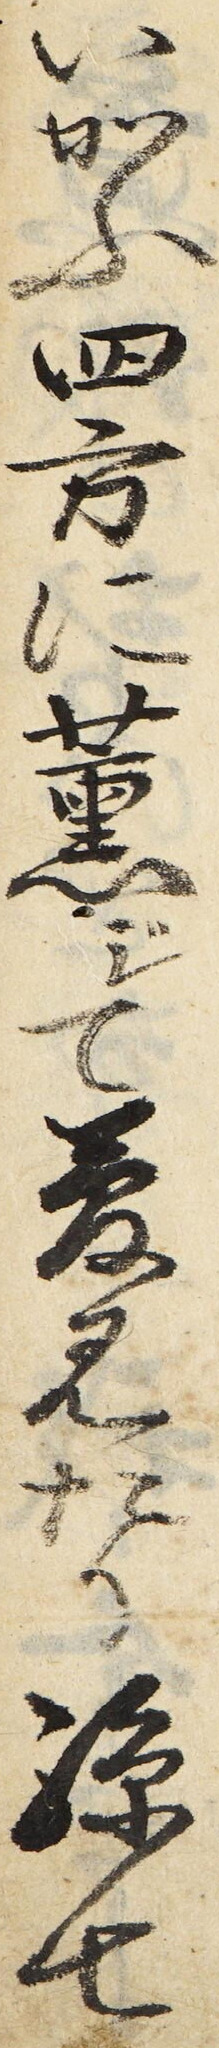いかに四方に薫じて夢見たり孫七

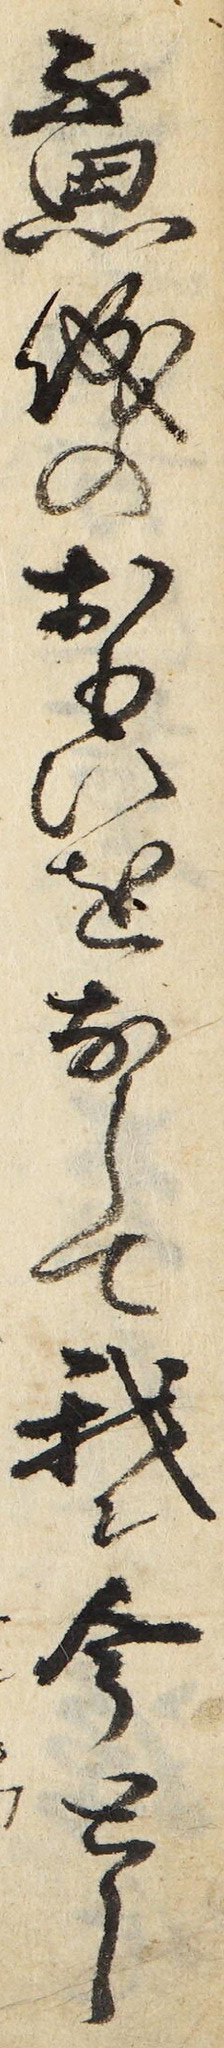不思儀のおもいをなして我れ今とし
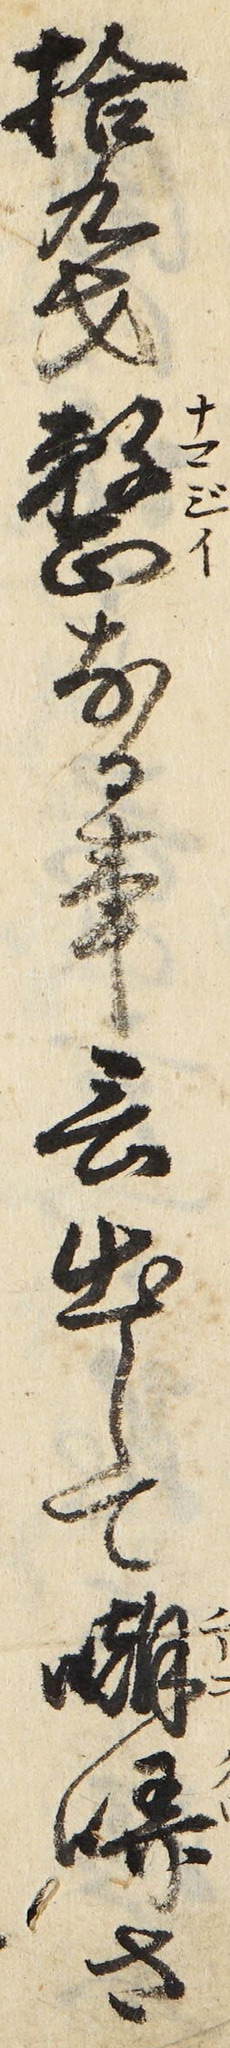拾九才整なる事云出して嘲哢さ
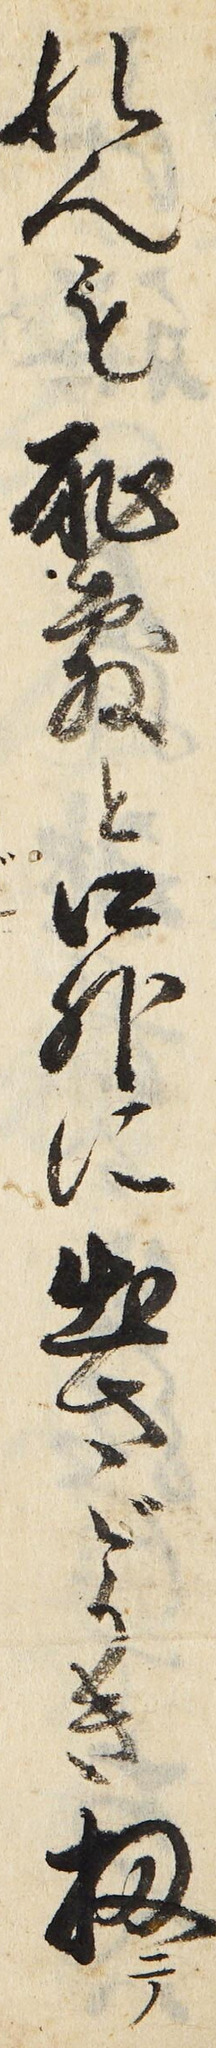れんも恥敷と口外に出さざりき扨て
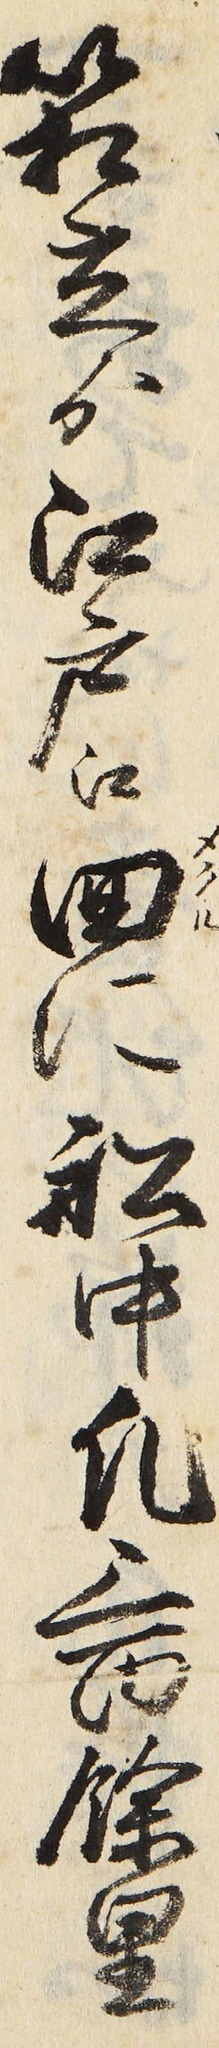箱立ゟ江戸え回に船中凡三百余里
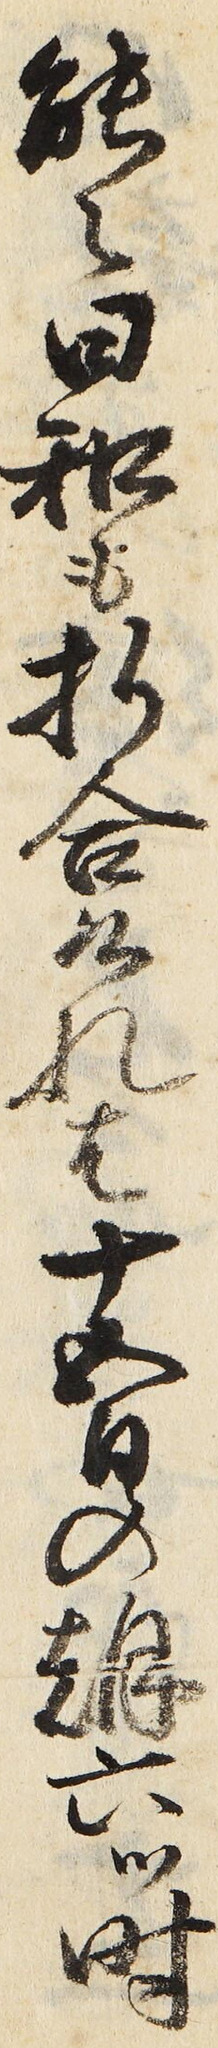能々日和も折合けれは十五日の朝六つ時
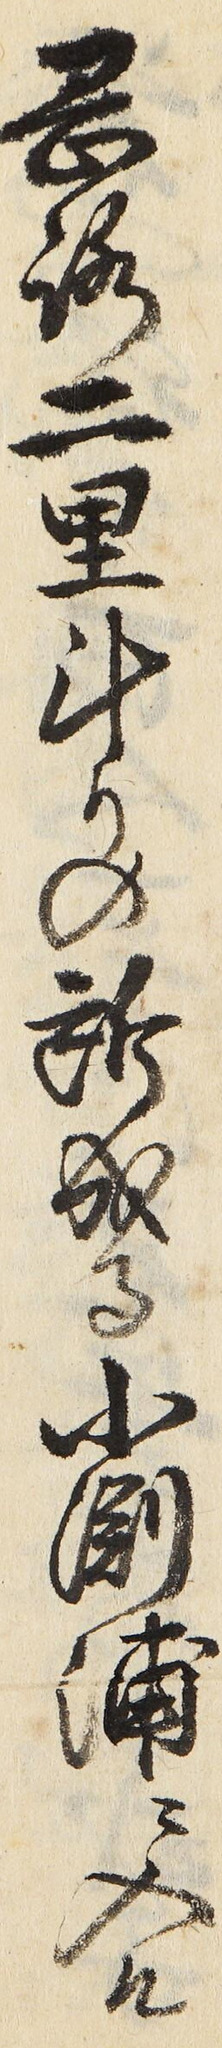岡路二里計りの所成る小渕浦に入る
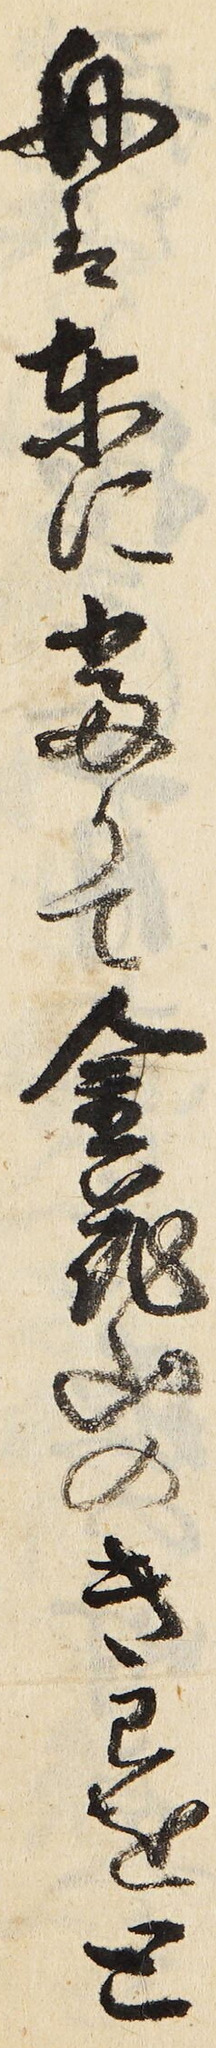舟は東に当りて金花山のきわをと
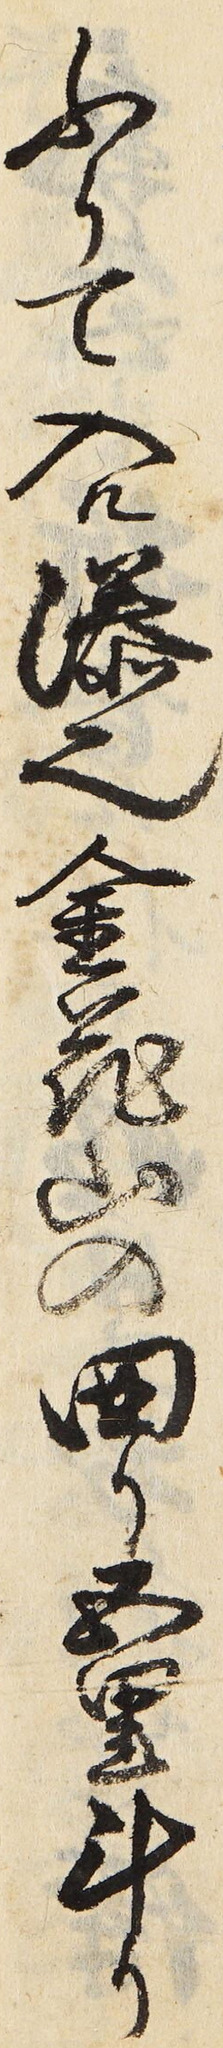ふりて入る湊也金花山回り五里計り
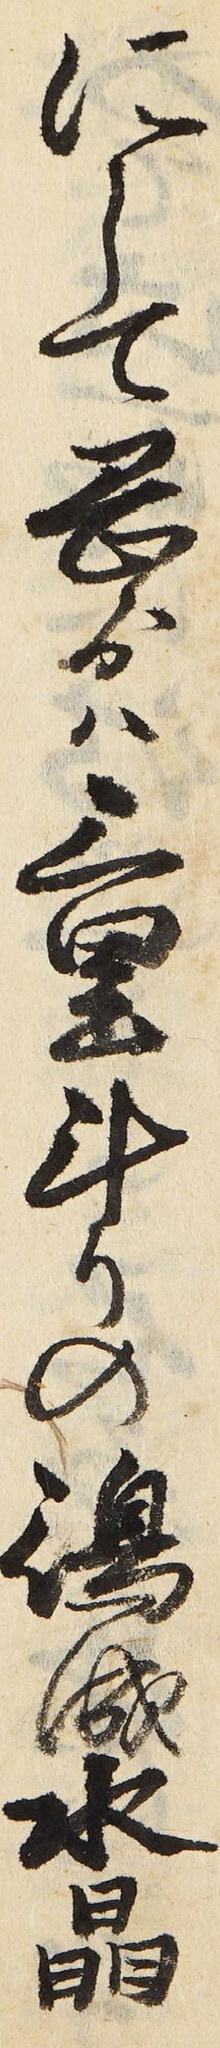にして岡ゟは三里計りの嶋成水晶
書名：華夷九年録
